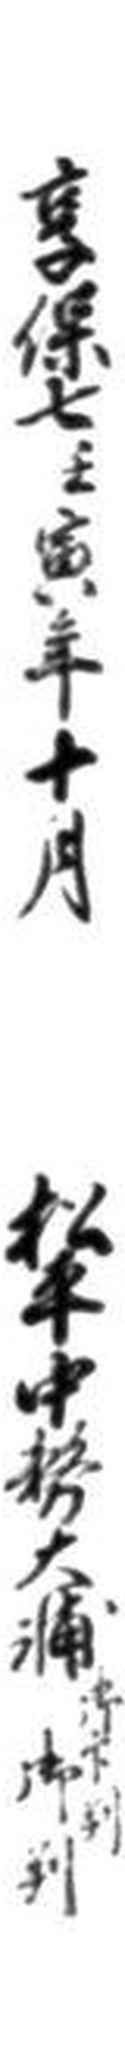享保七壬寅年十月松平中務大輔御印判
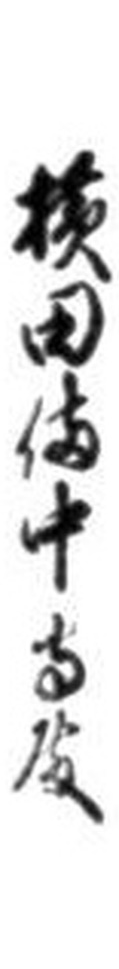横田備中守殿
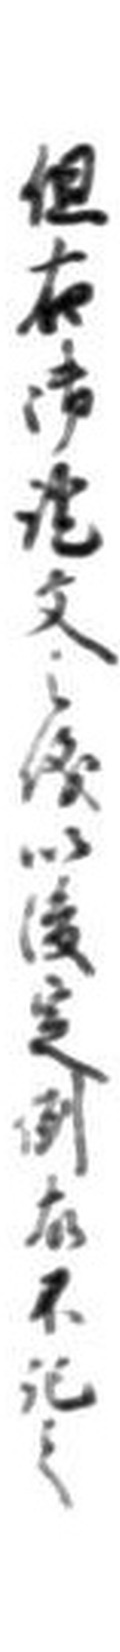但右御証文之儀以後定例故不記之
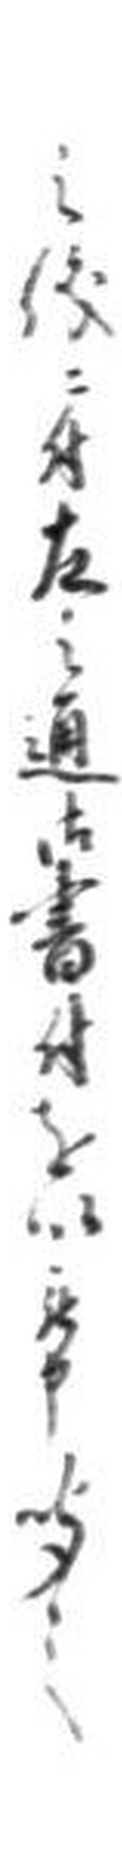之儀ニ付左之通御書付を以被申聞之
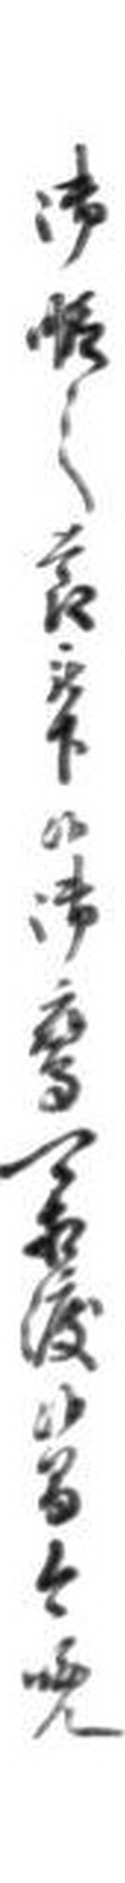御暇之節被下候御鷹可相渡候間今晩
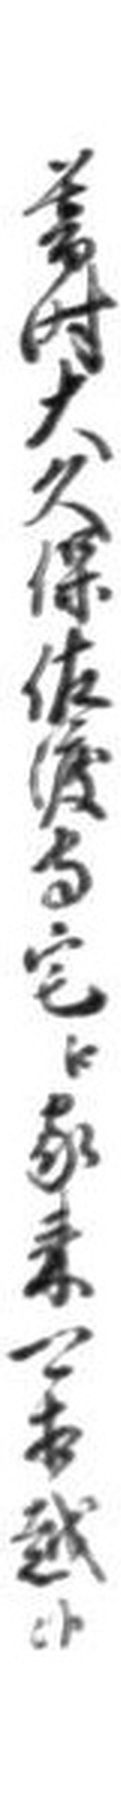暮時大久保佐渡守宅江家来可相越候

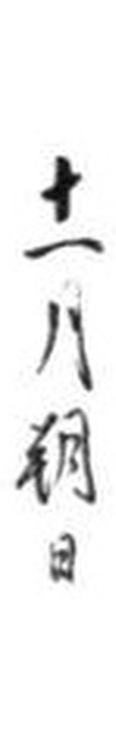十一月朔日
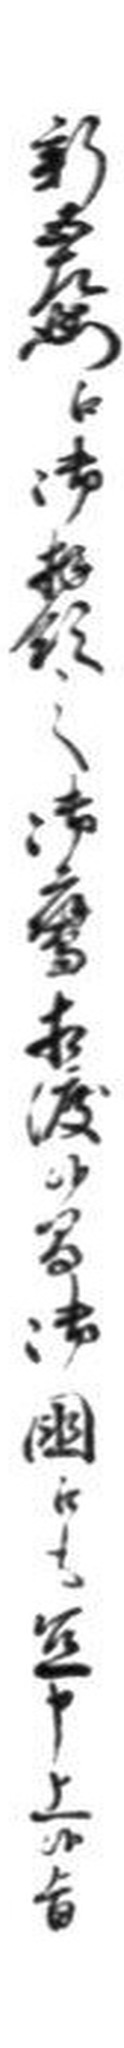新五左衛門江御拝領之御鷹相渡候間御国江も宜申上候旨
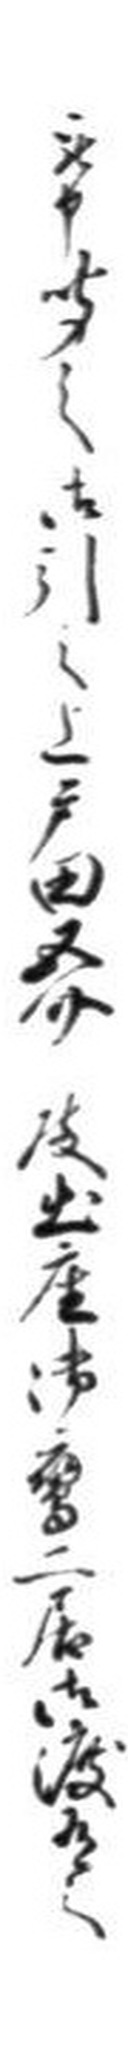被申聞之御引之上戸田五介殿出座御鷹二居御渡有之
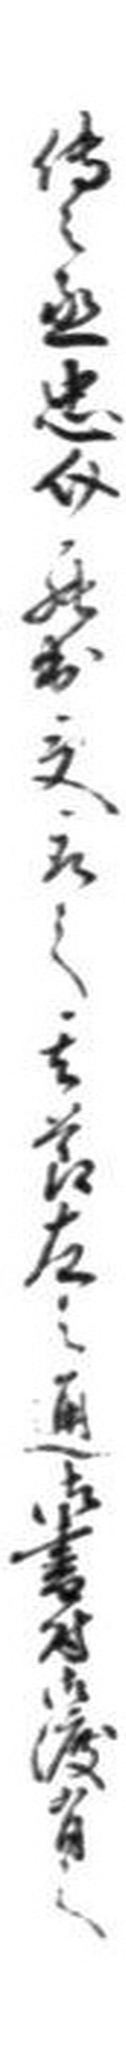伝之丞忠介罷出受取之其節左之通御書付御渡有之
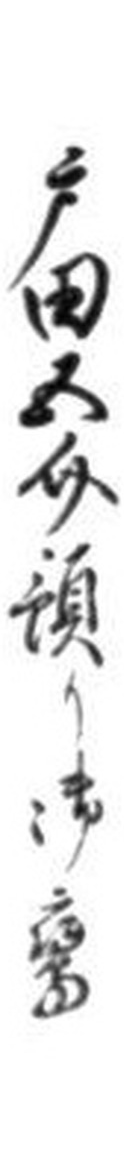戸田五介預り御鷹
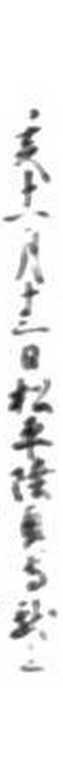一鳫捉亥十一月十三日松平陸奥守献上
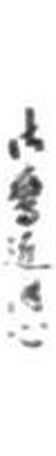御鷹匠同心
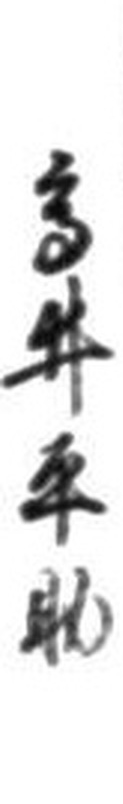高井平助
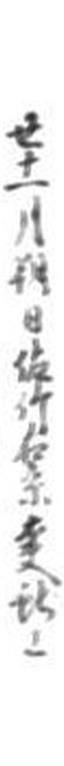一鴨捉丑十一月朔日佐竹右京大夫献上
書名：家譜 三十五 宗昌公 従享保六年到同七年
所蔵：福井県文書館 Fukui Prefectural Archives
